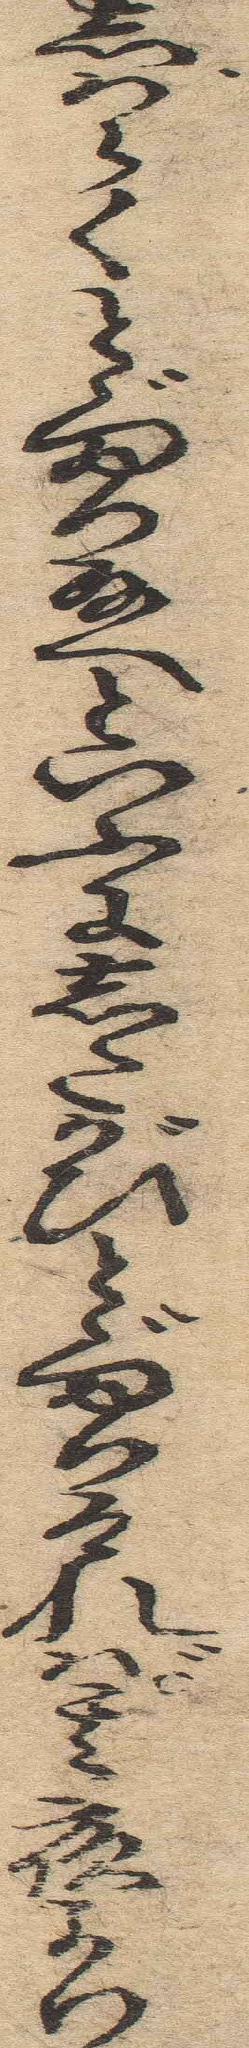しばらくとゞまり給へといふにしたがひとゞまりければ。其夜より
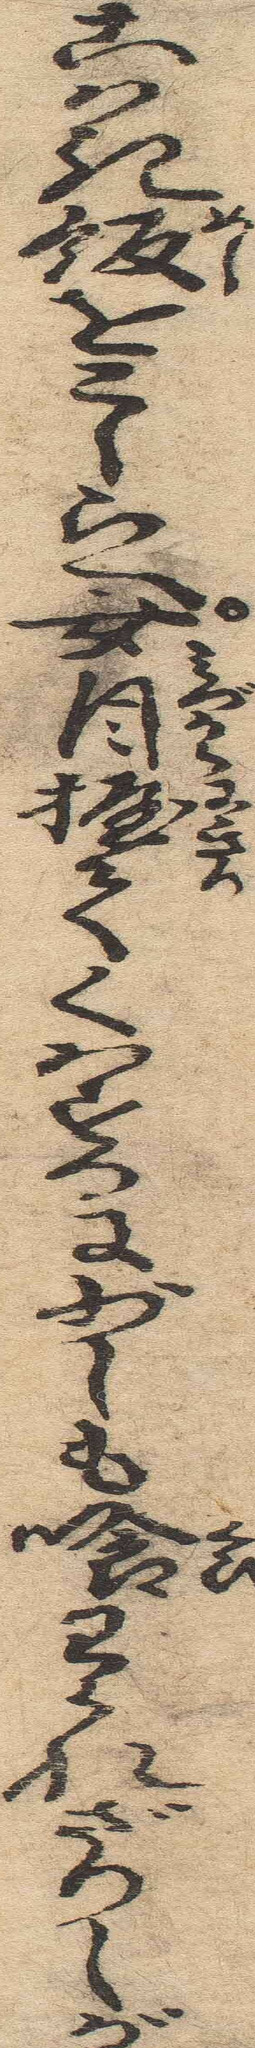こはき飯をこしらへ。女自握てくはするに喰わられざりしが
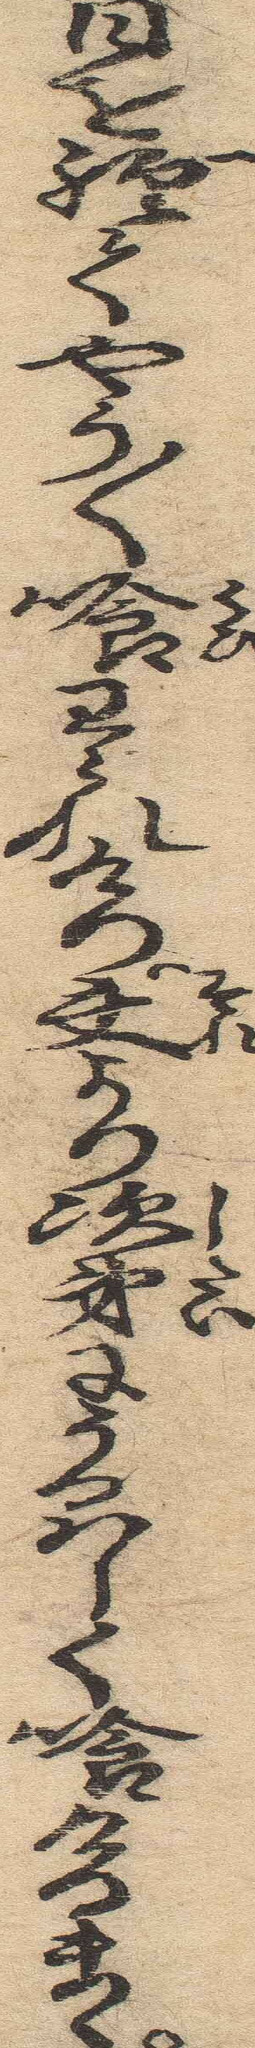日を経てやう〳〵喰わられけり夫より次第にうるはしく喰けるまゝ。
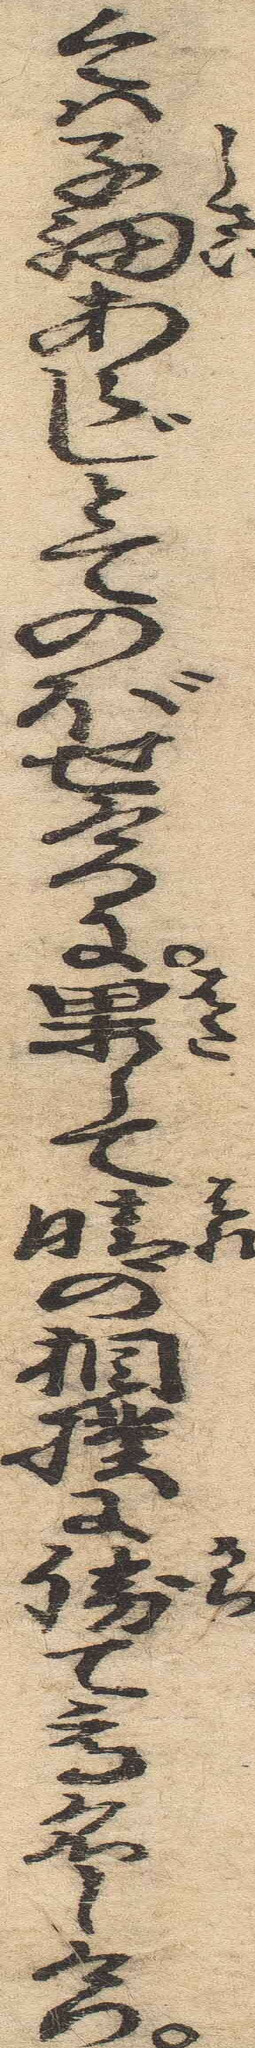今は子細あらじとてのぼせけるに。果して晴の相撲に勝て高名しけり。
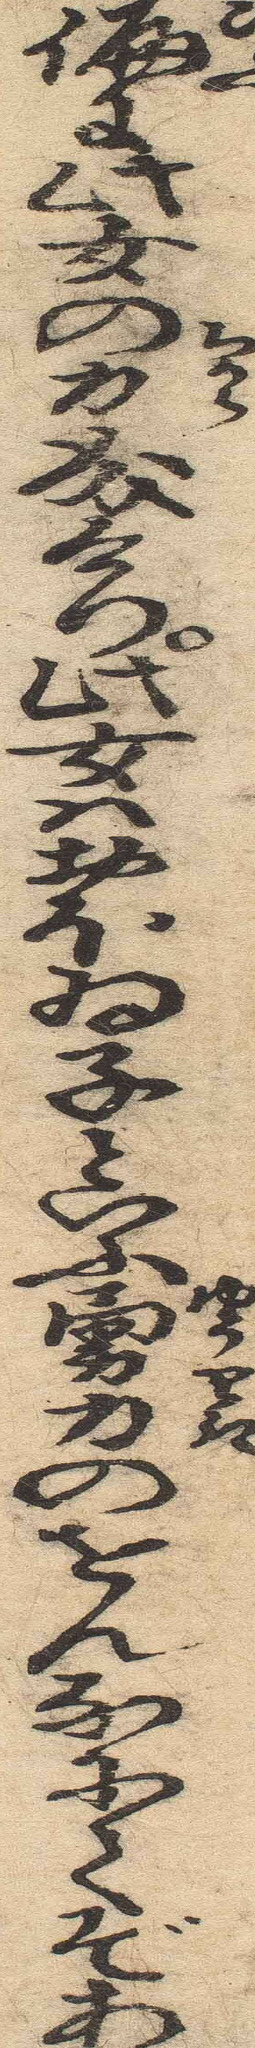偏に此女の力成けり。此女はおほゐ子といふ勇力のおんなにてぞあ
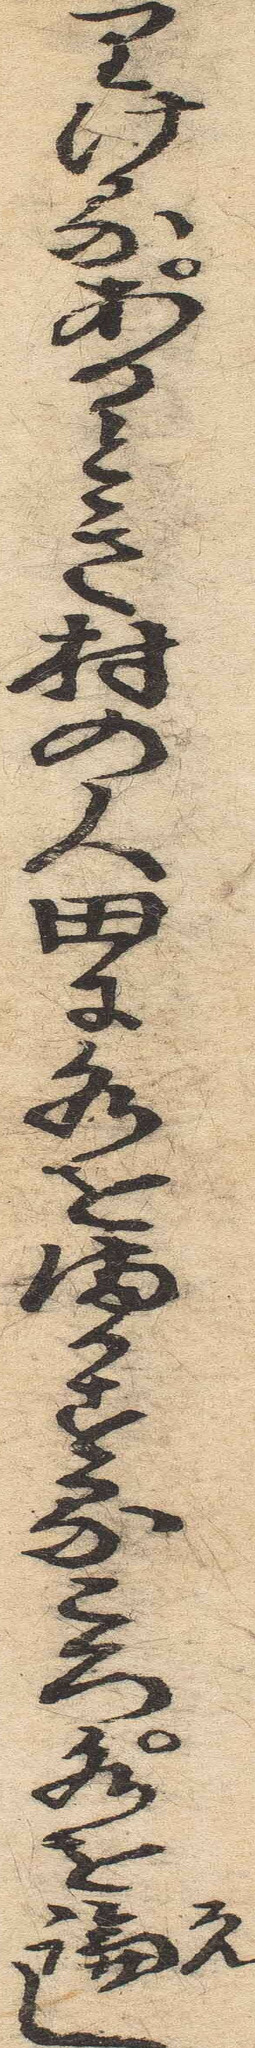れける。あるとき村の人田に水をまかするころ。水を論し
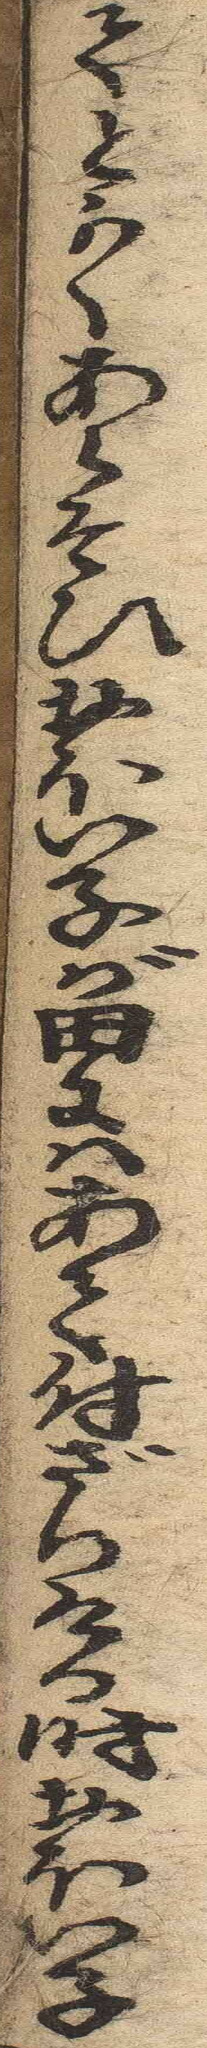てとかくあらそひおほい子が田にはあて付ざりける時おほい子
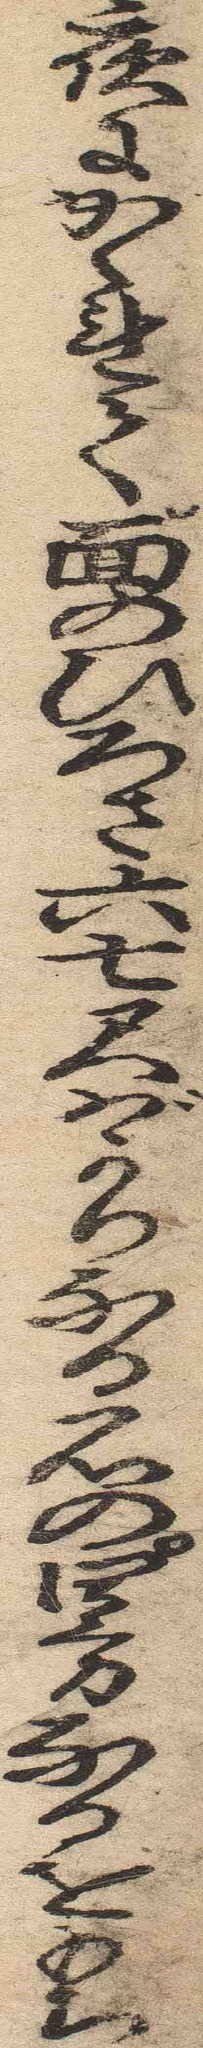夜にかくれて面のひろさ六七尺ばかりなる石の四方なるをもち
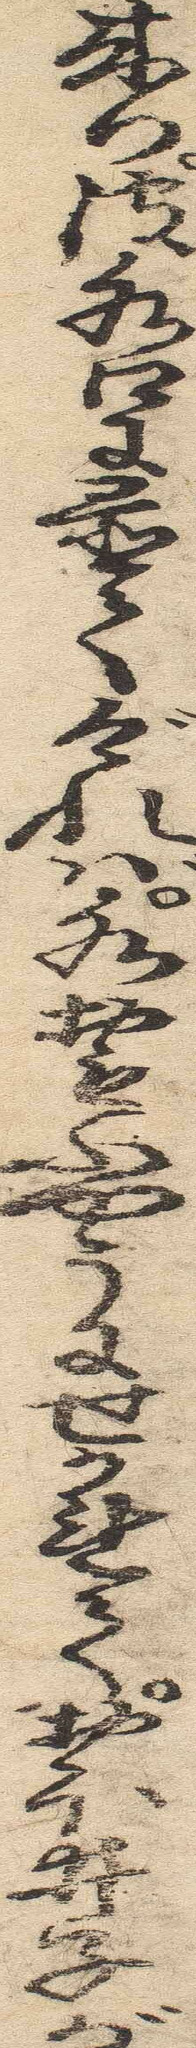来り。彼水口に置てければ。水おもふやうにせかれて。おほい子が。
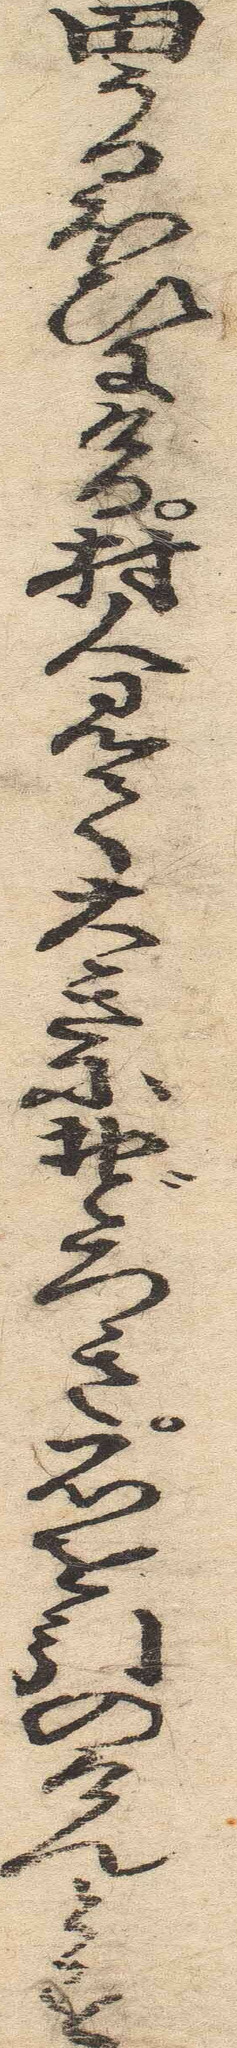田うるほひにけり。村人見て大きにおどろき石を引のけんとす
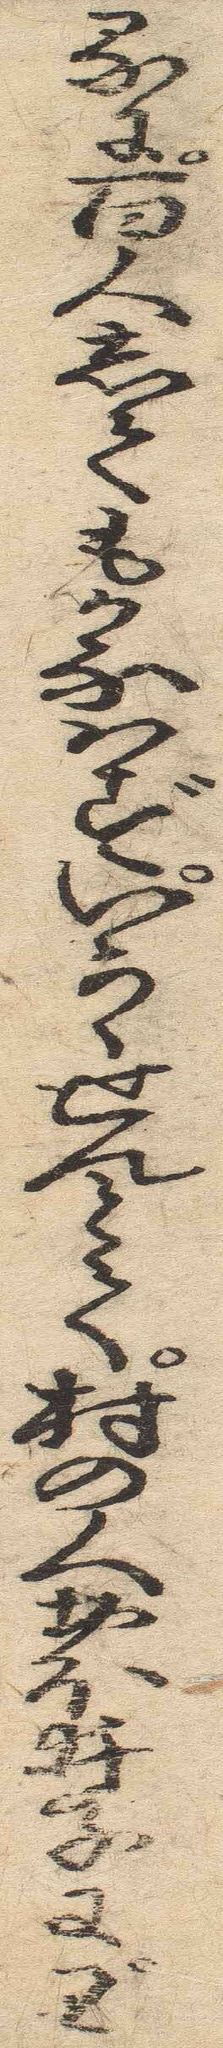るに百人してもかなはず。いかゝせんとて。村の人おほい子にわ
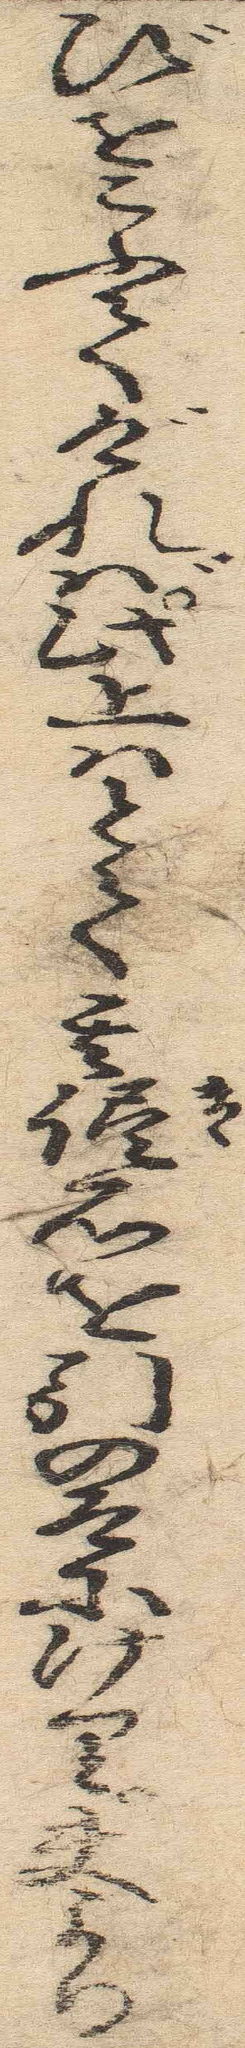びをこふてければ。此上はとて其侭石を引のけり。夫より
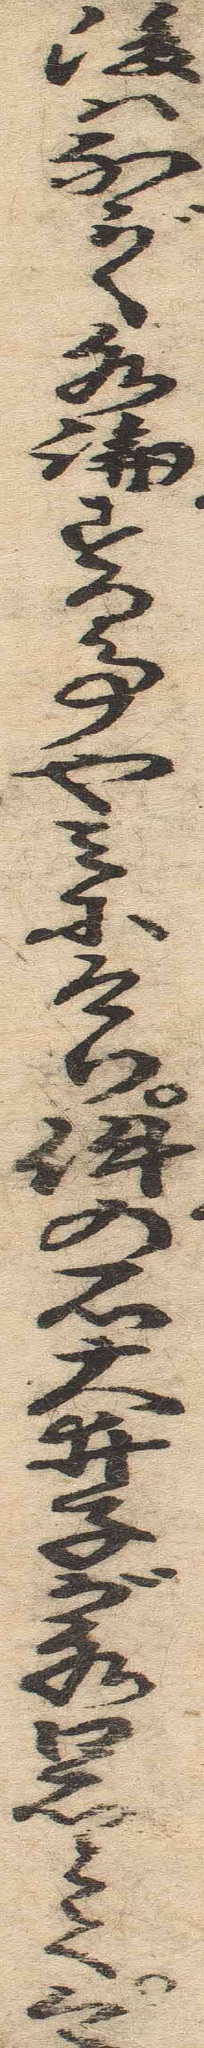後はながく水論する事やみにけり。件の石大井子が水口石とて。今
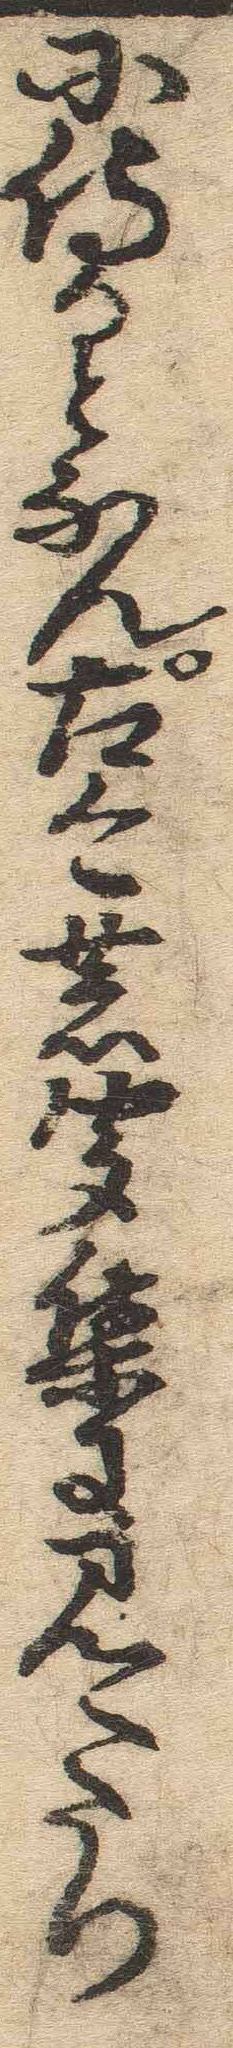に伝るとなん。古今著聞集に見へたり
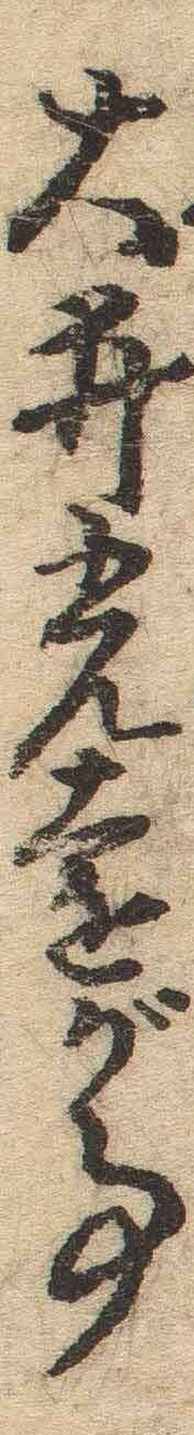大井光遠が事
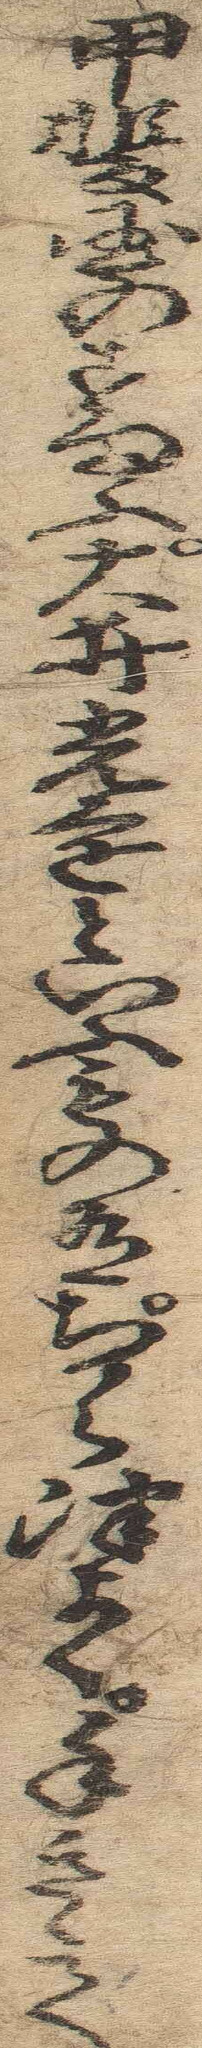甲斐国のすまふ。大井光遠といふもの有。ちからつよく。手きたへ
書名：古今相撲大全
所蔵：東京学芸大学附属図書館 国文学研究資料館
